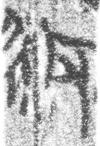○（鞶）
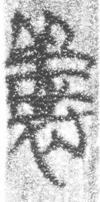襄（囊）
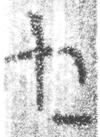七
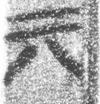亓（其）
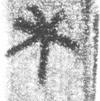木
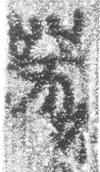器
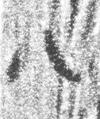八
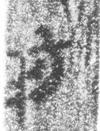方
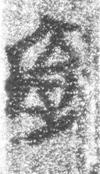琦
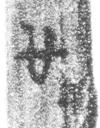廿
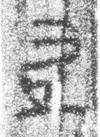豆
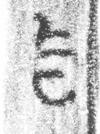屯
